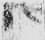八
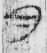月
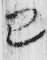己
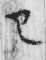巳
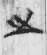之
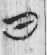日
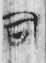司
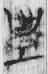豊（禮）
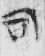司
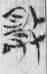敗
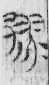鄝
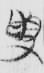受
